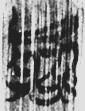能
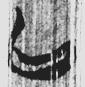㠯（以）
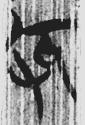辱
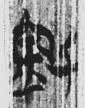○（斧）
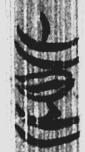疐（鑕）
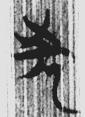先
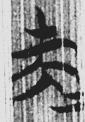大
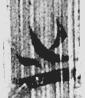之
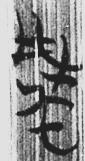風（諷）
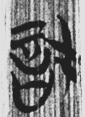{言才}（裁）
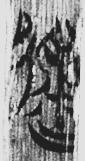{辶𦥔少}（遺）
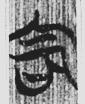命
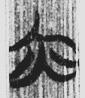亦
